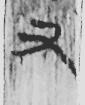又
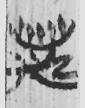萬
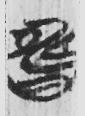𠷎
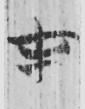才
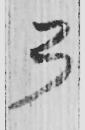乃
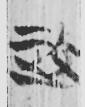政
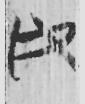女
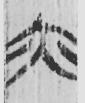亦
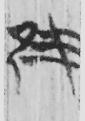隹
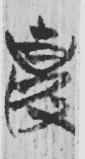尅
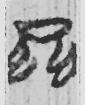㬎
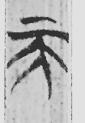天
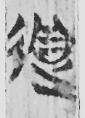迵
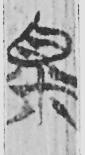眔
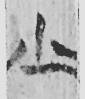少
